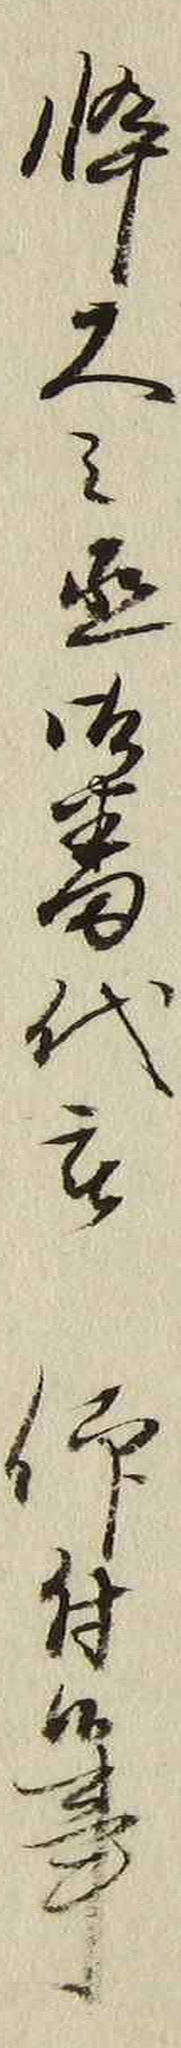忰大之丞御番代被仰付候事
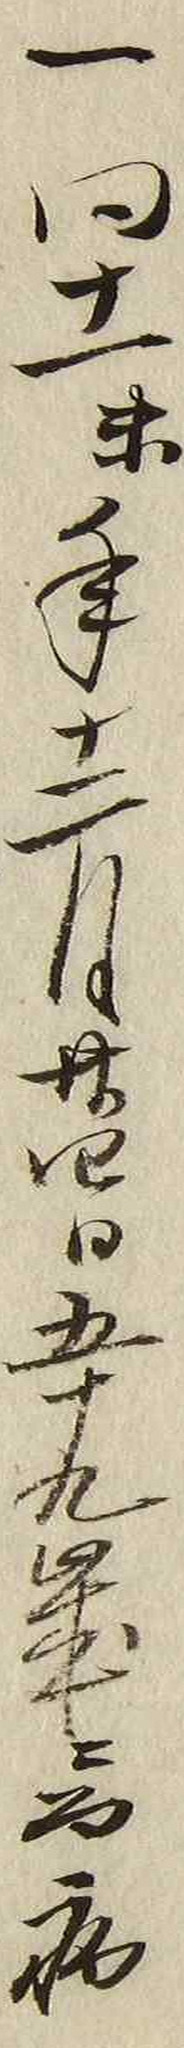一同十一未年十二月廿四日五十九歳ニ而病
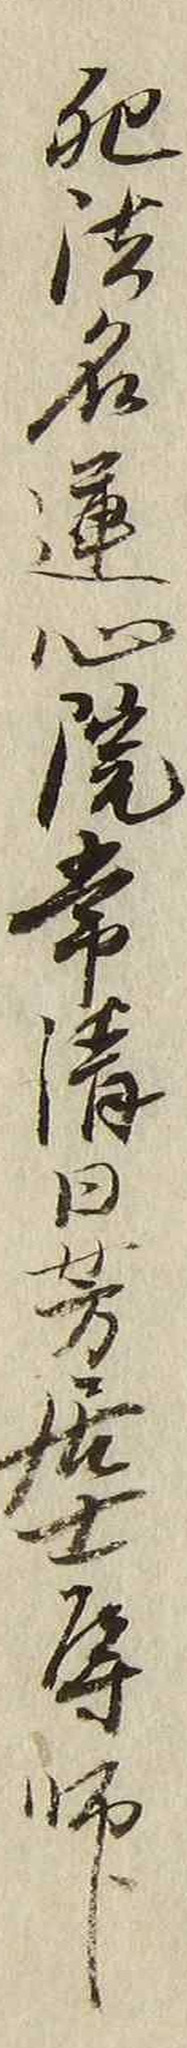死法名連心院常清日芳居士導師

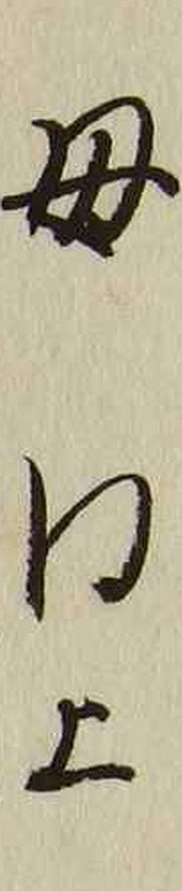母同上
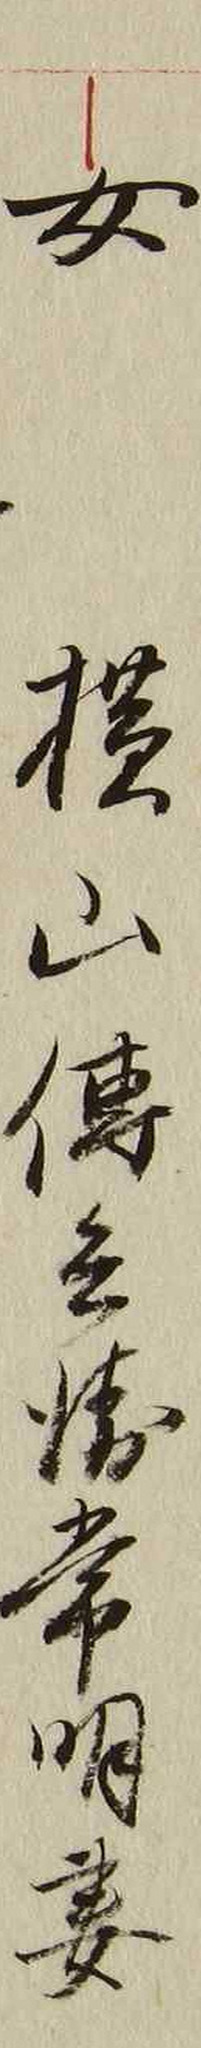女横山伝兵衛常明妻
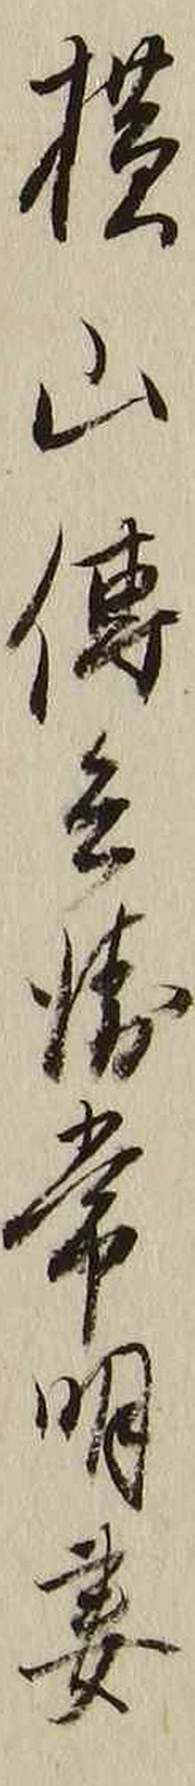女横山伝兵衛常明妻
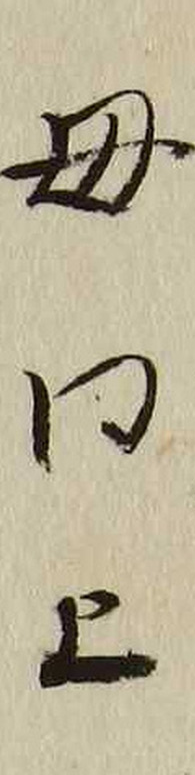母同上
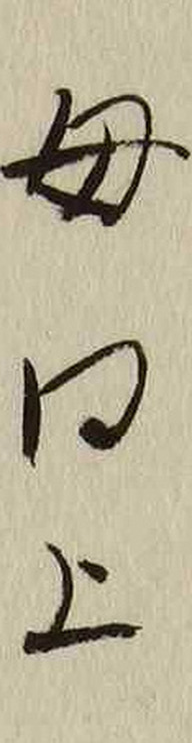母同上
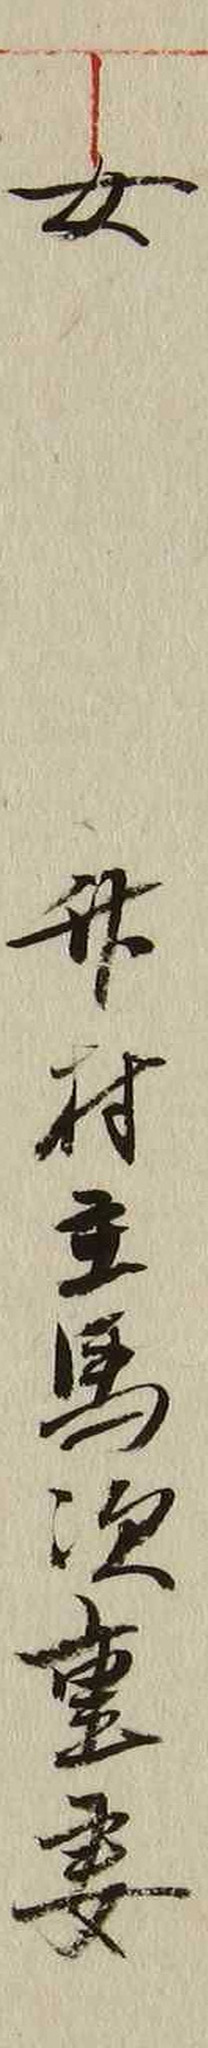女竹村主馬次重妻
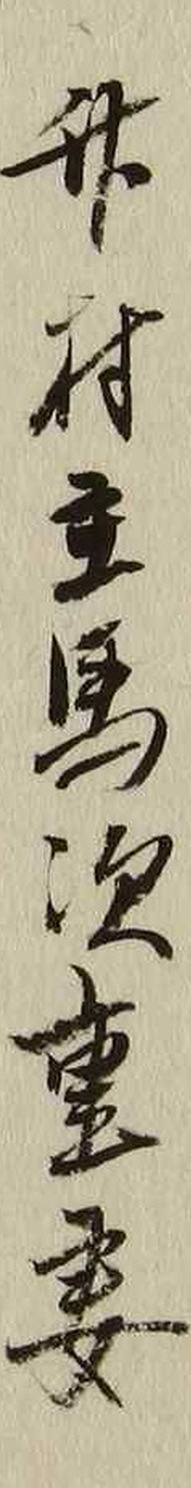女竹村主馬次重妻
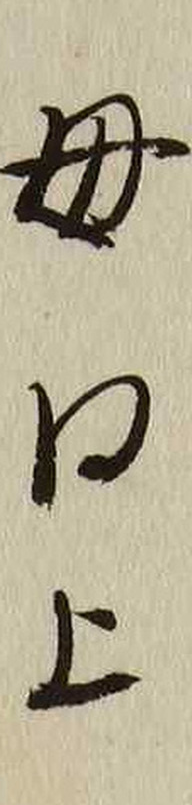母同上
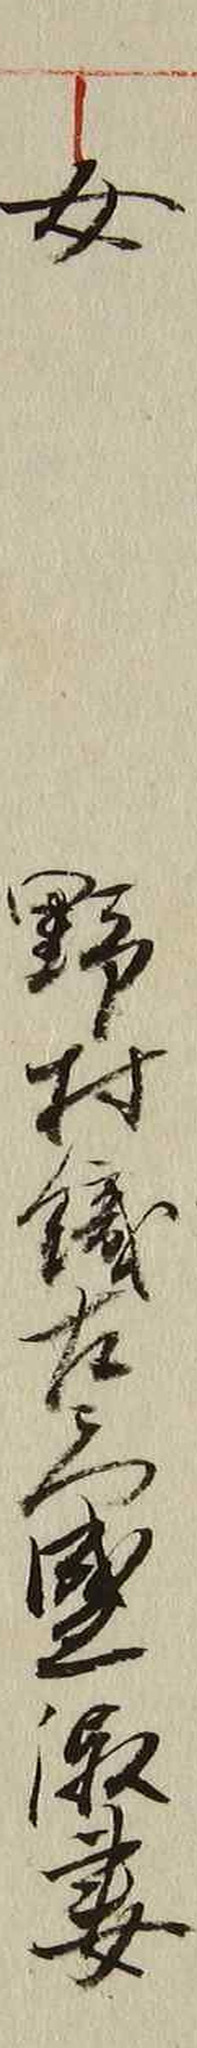女野村織左衛門盛淑妻
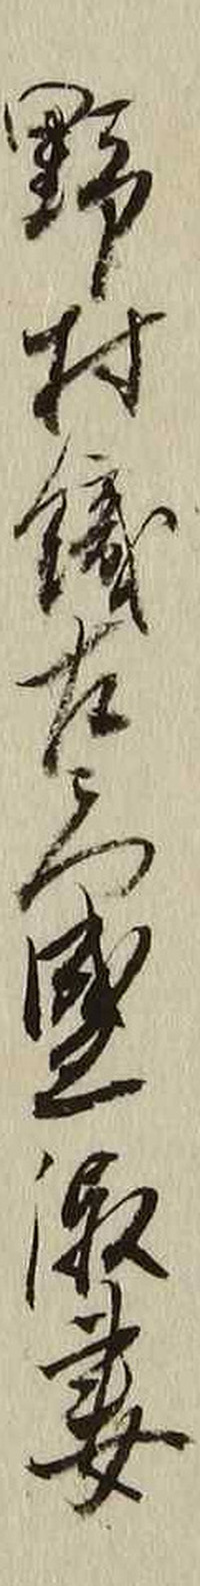女野村織左衛門盛淑妻
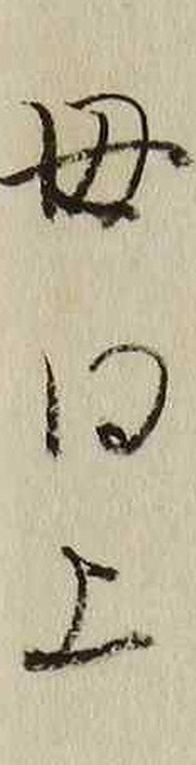母同上
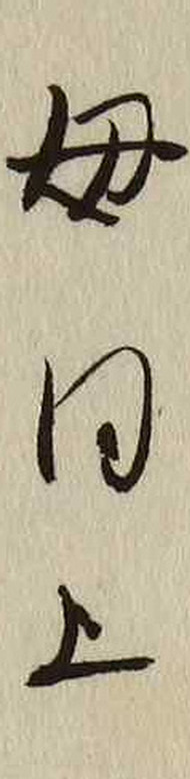母同上
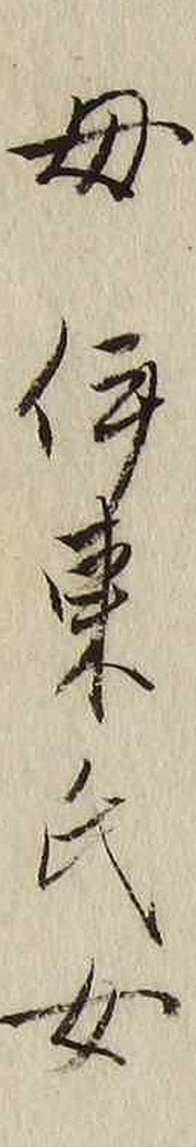母伊東氏女
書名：諸士系譜　巻之351　す之部1
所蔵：会津若松市立会津図書館
